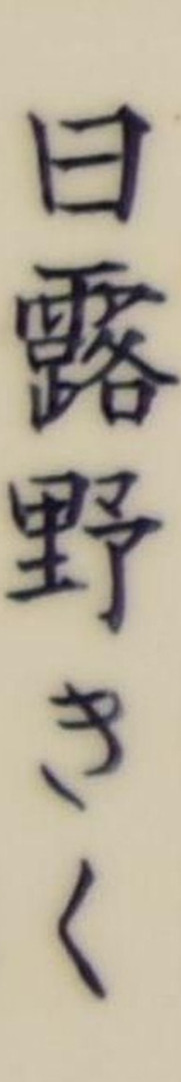日露野きく
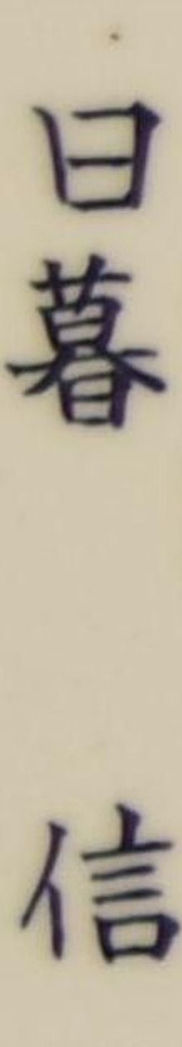曰暮信
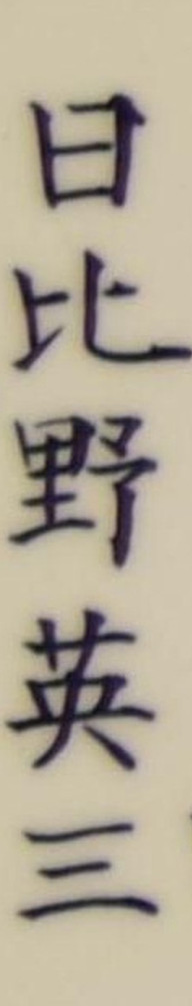日比野英三
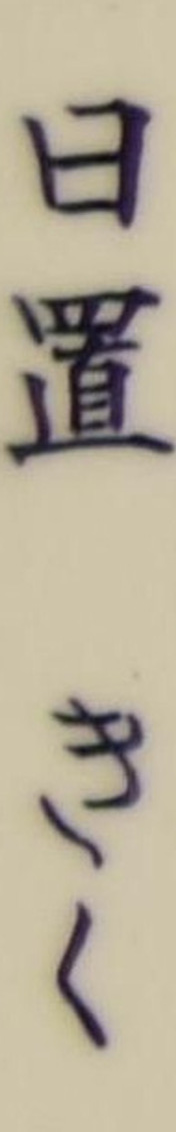日置きく

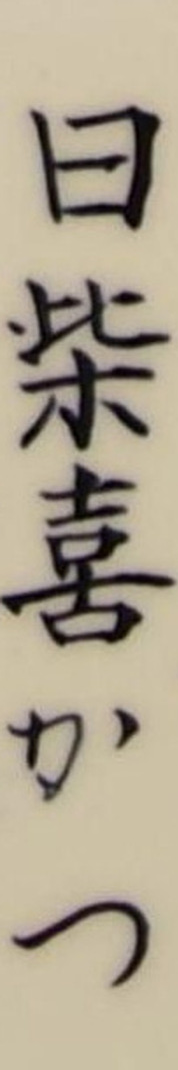日柴喜かつ
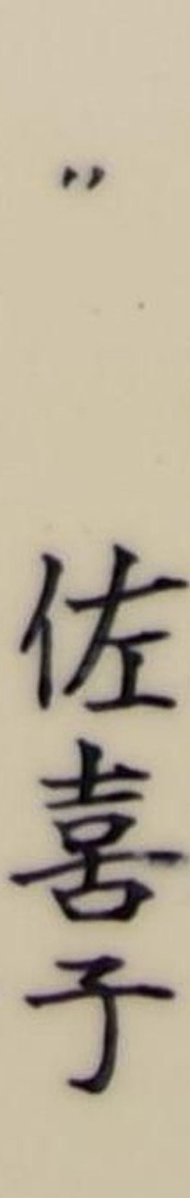佐喜子
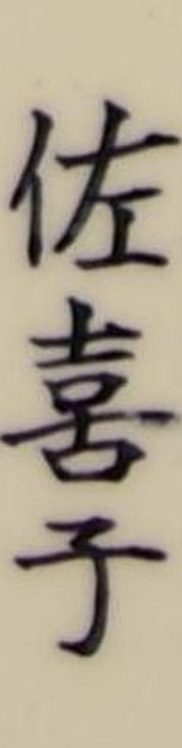佐喜子
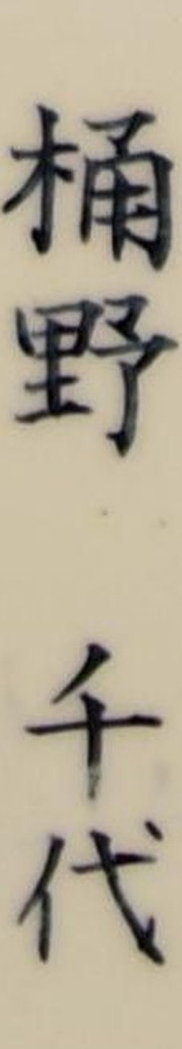桶野千代
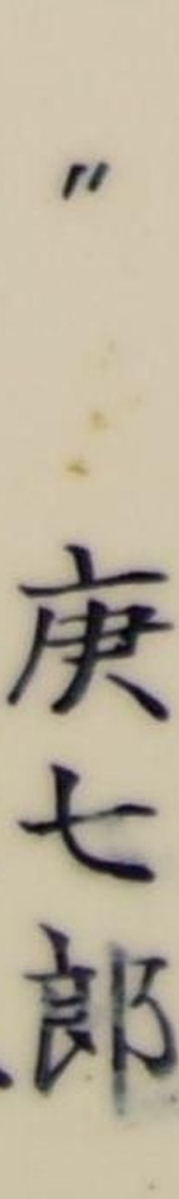庚七郎
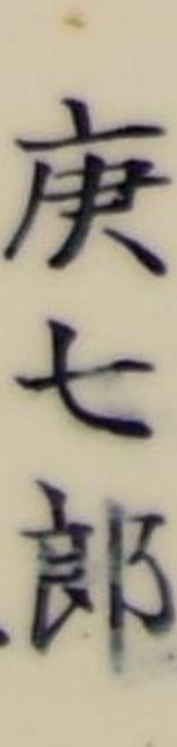庚七郎
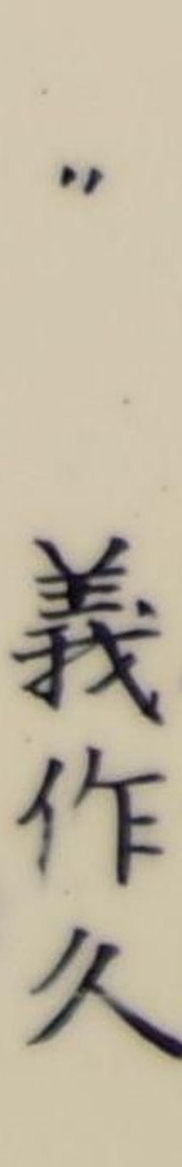義作久
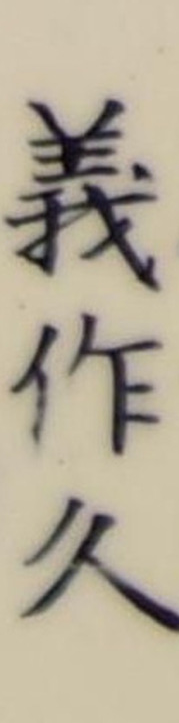義作久
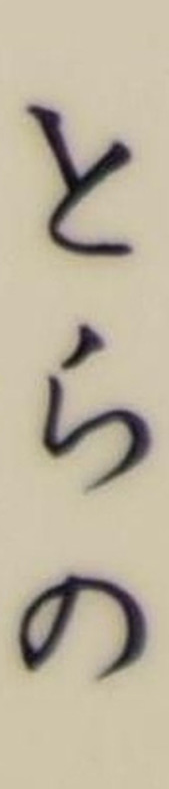とらの
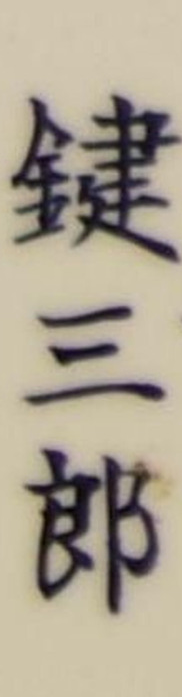健三郎

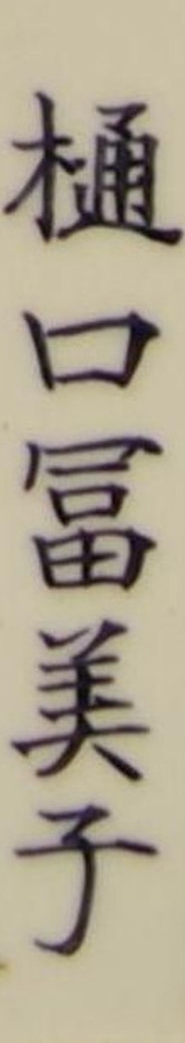樋口冨美子
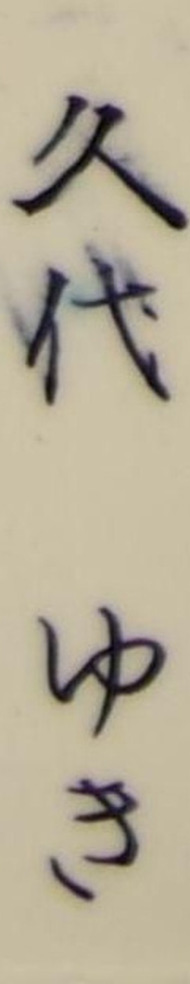久代ゆき
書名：A~D
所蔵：koyasan kongobuji
